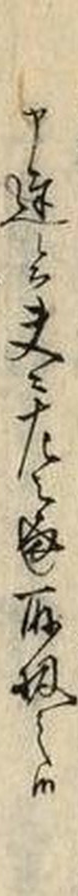申達候て夫々左之通取扱之候
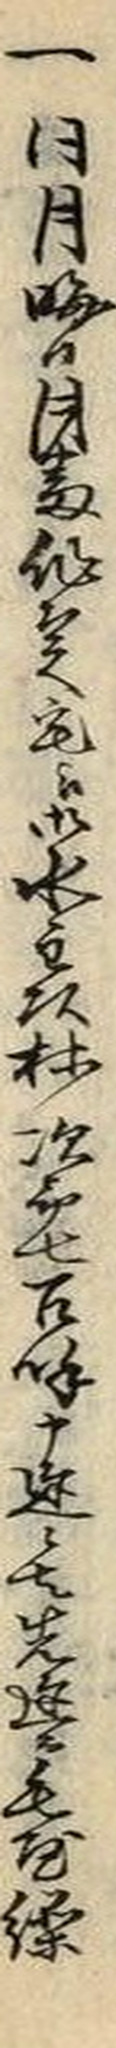一同月晦日月番作大夫宅え御水主頭林次郎七召呼申達候は先達て毛屋繰
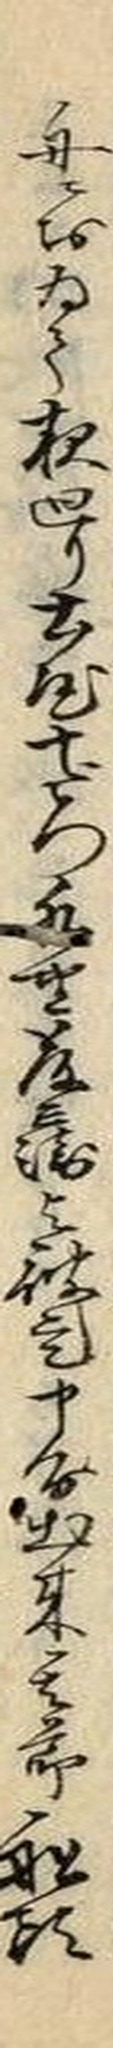舟におゐて夜廻り土屋十郎右衛門水野藤兵衛と彼是申分出来其節船頭
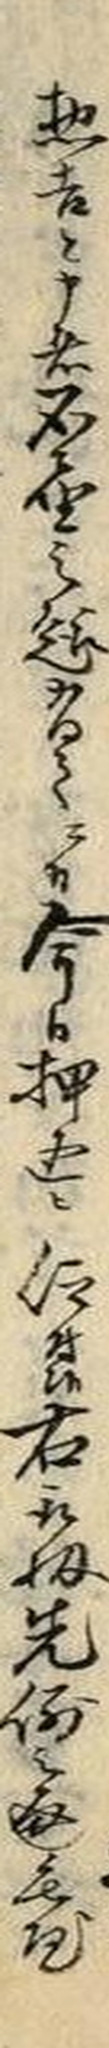惣吉と申者不届之趣有之に付今日押込被仰付候右取扱先例之通毛屋
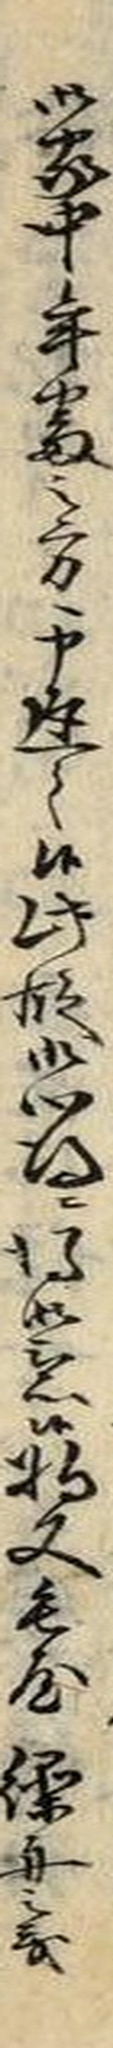御家中年番之方へ申達之候此段御心得に得御意候将又毛屋繰舟之義
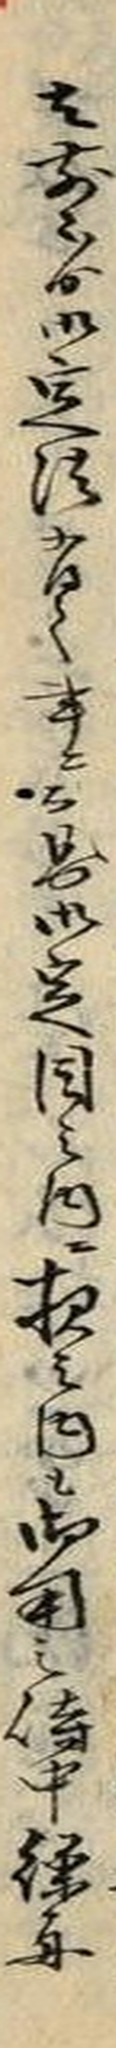は前々ゟ御定法有之事にて則御定目之内に夜之内も御用之侍中繰舟

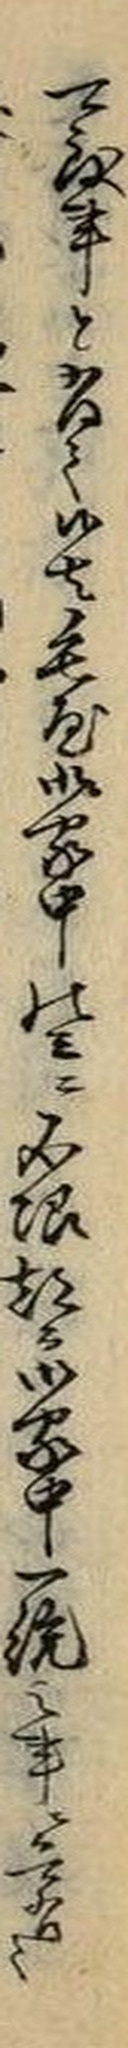可致事と有之候は毛屋御家中のみに不限都て御家中一統之事にて可有之
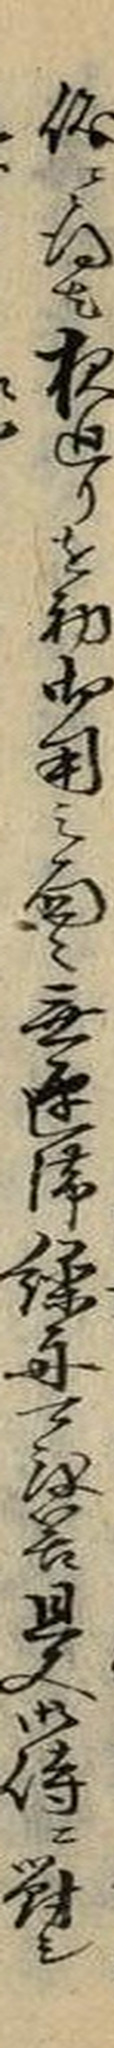儀に候得は夜廻りを初御用之面々無遅滞繰舟可致筈且又御侍に対シ
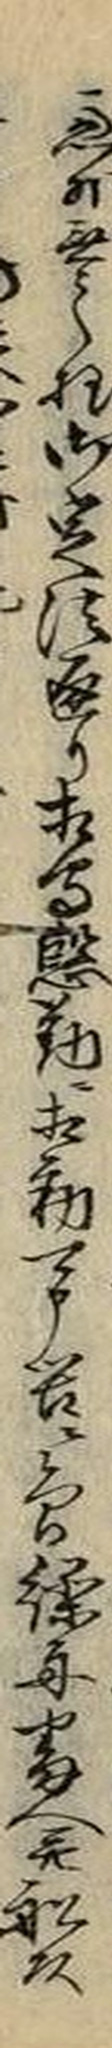慮外無之様御定法通り相守慇勤に相勤可申筈に候間繰舟番人并船頭
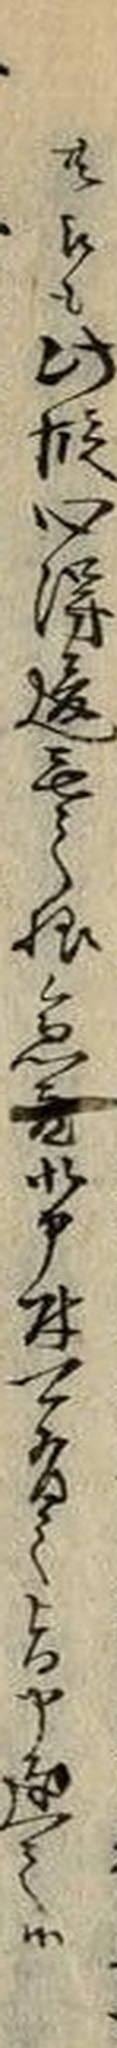共えも此段心得違無之様急度御申付可有之旨申達之候
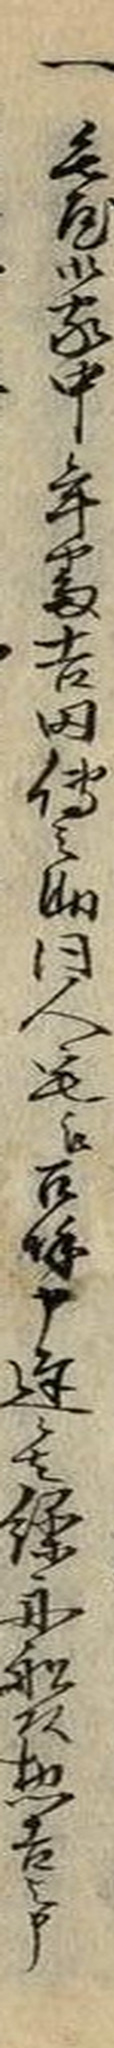一毛屋御家中年番吉田伝之助同人宅え召呼申達候は繰舟船頭惣吉と申
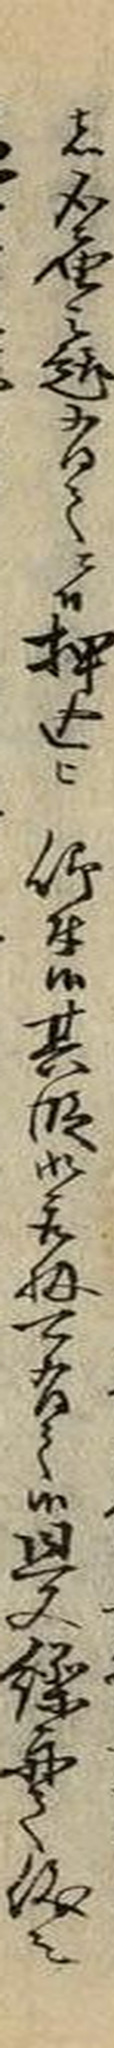者不届之趣有之に付押込被仰付候其段御取扱可有之候且又繰舟之儀は
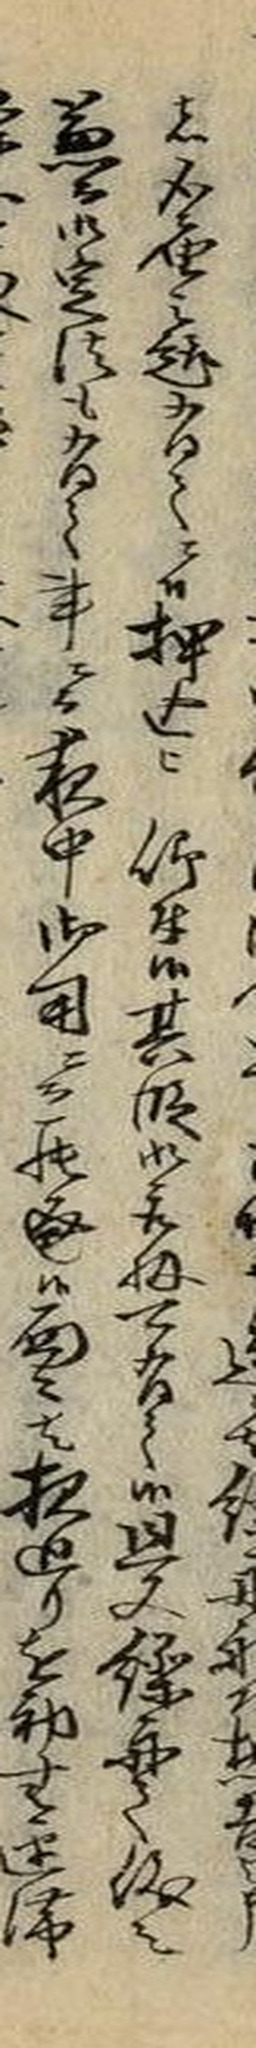兼て御定法も有之事にて夜中御用にて罷通候面々は夜廻りを初無遅滞
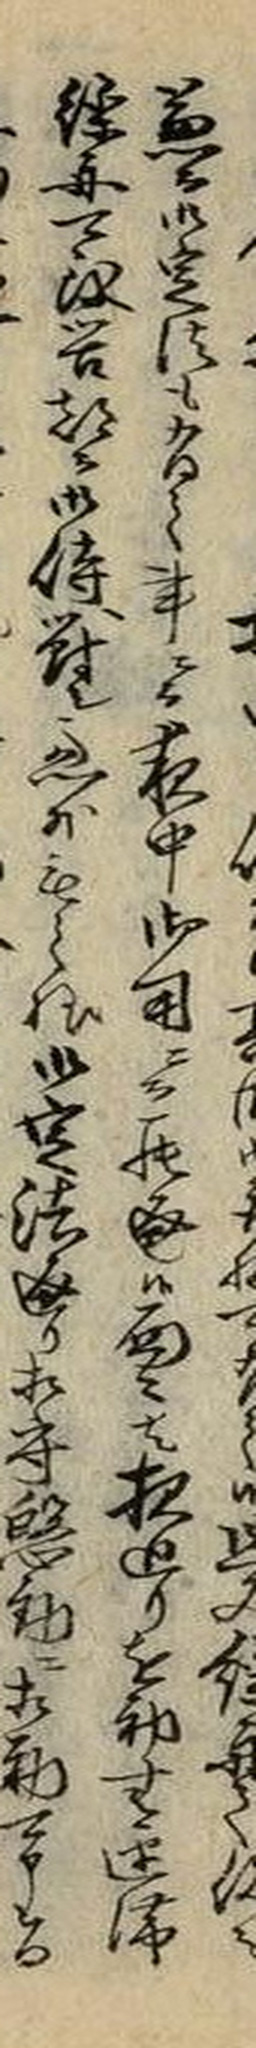繰舟可致筈都て御侍へ対シ慮外無之様御定法通り相守慇勤に相勤可申旨
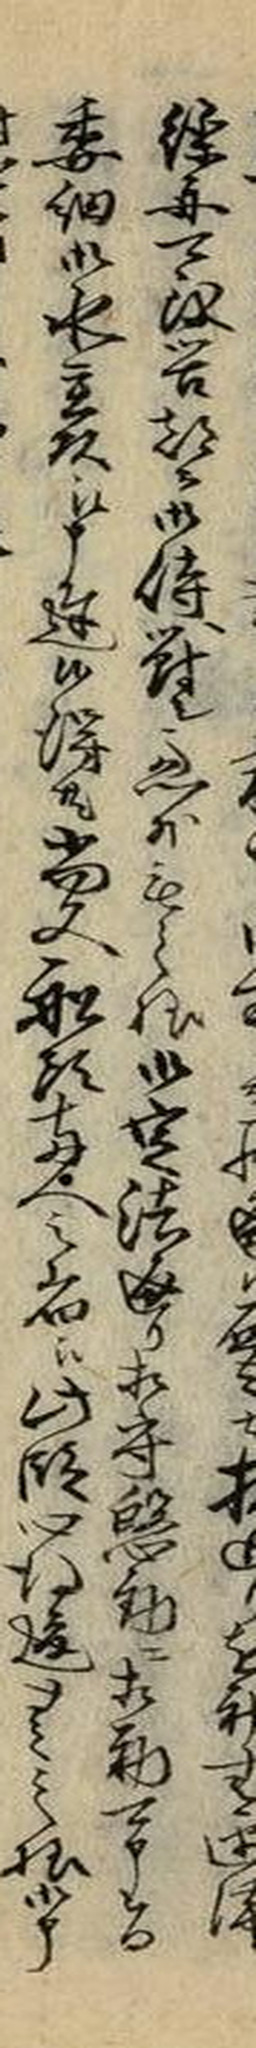委細御水主頭え申達候得共尚又船頭両人之者え此段心得違無之様御申
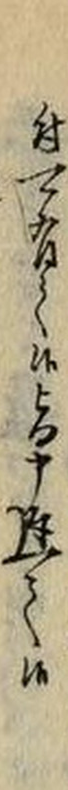付可有之候旨申達之候
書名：御城下諸事之部
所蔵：福井県文書館 Fukui Prefectural Archives
